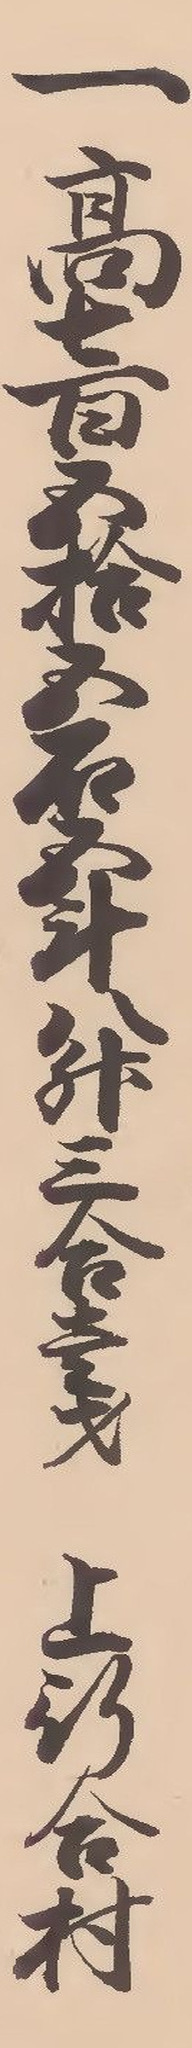一高七百五拾五石五斗八升三合壱才上行合村
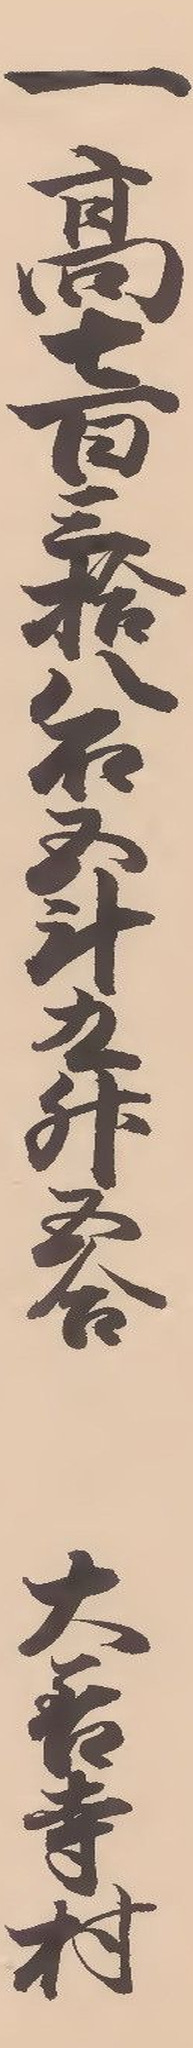一高七百三拾八石五斗九升五合大善寺村
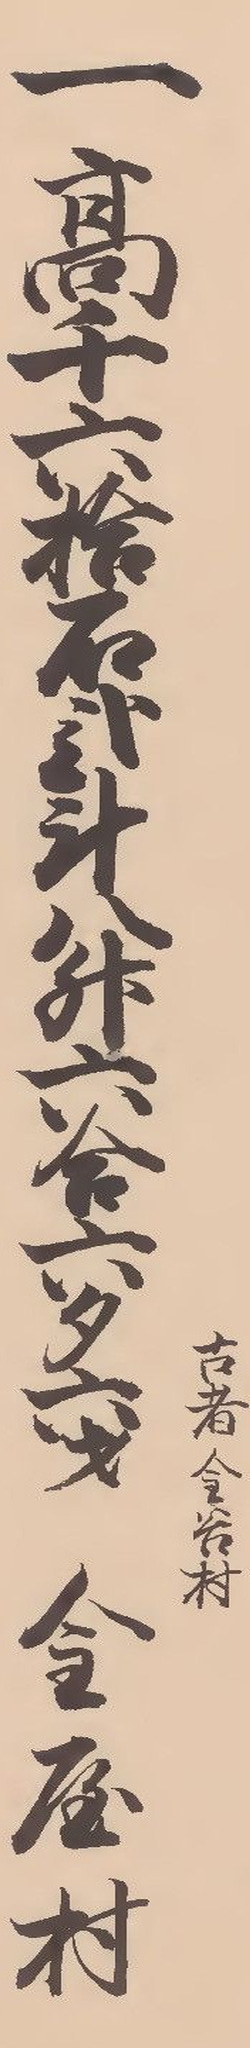一高千六拾石弐斗八升六合六勺六才金屋村
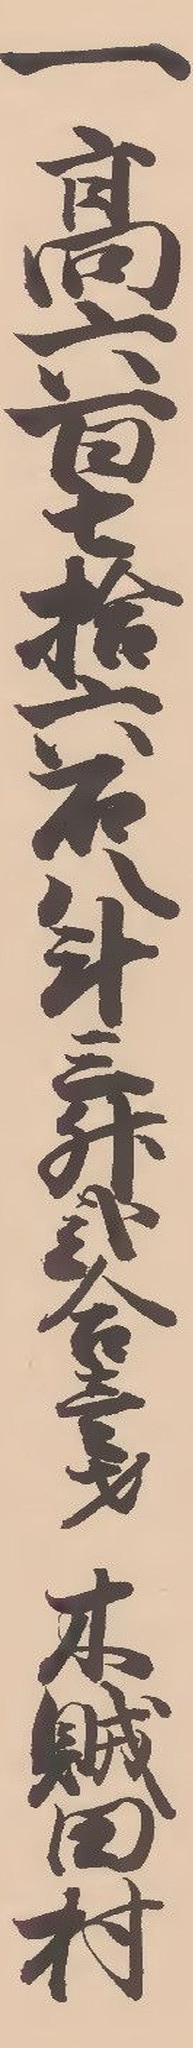一高六百七拾六石八斗三升弐合壱才木賊田村
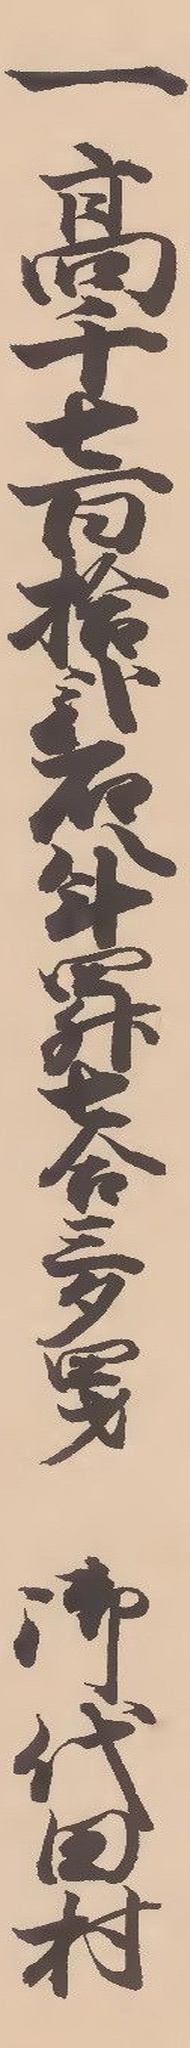一高千七百拾弐石八斗四升七合三勺四才御代田村
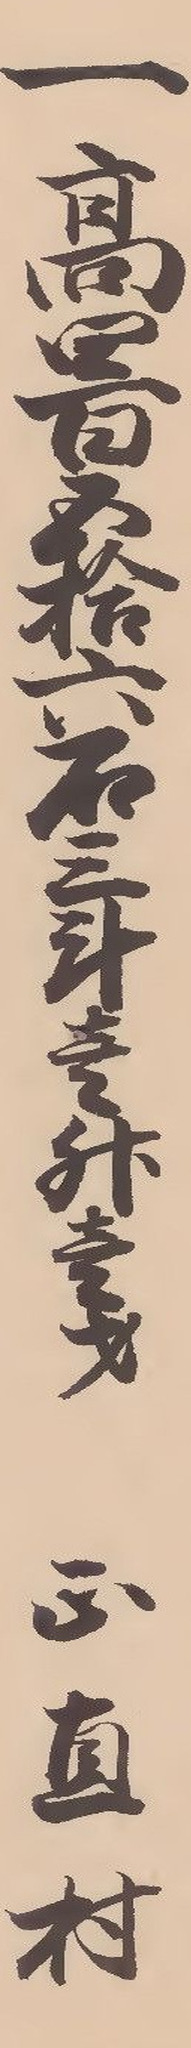一高四百五拾六石三斗壱升壱才正直村
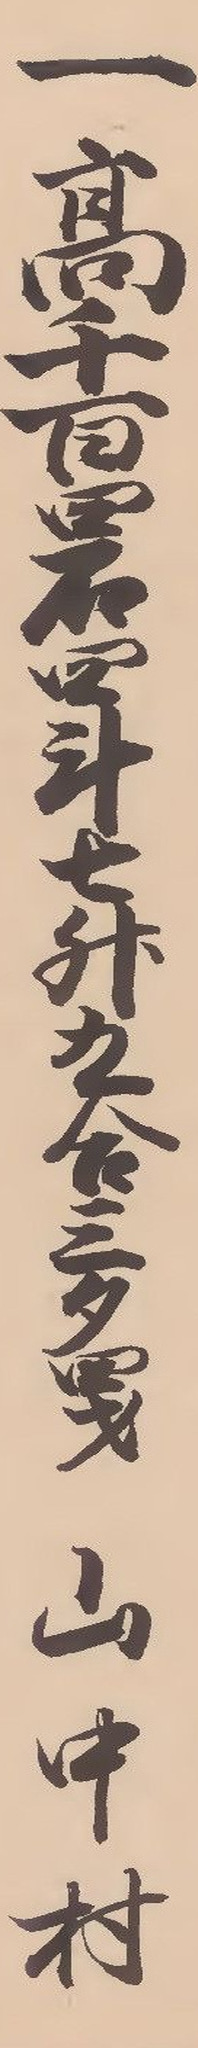一高千四百四石四斗七升九合三勺四才山中村
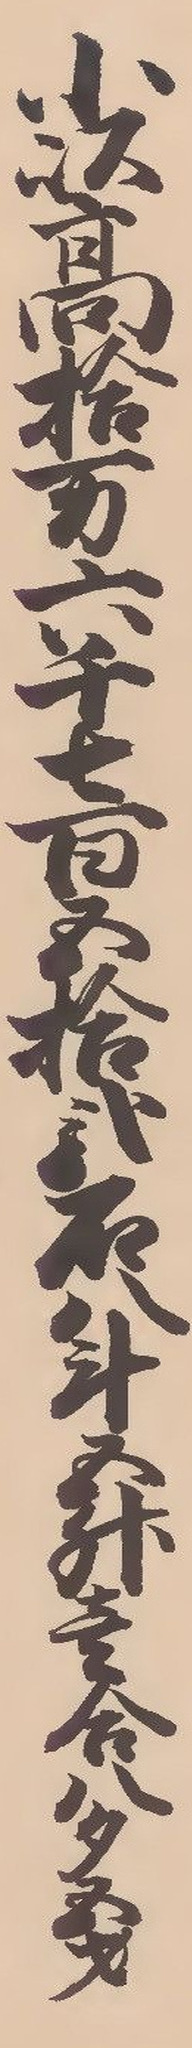小以高拾万六千七百五拾弐石八斗五升壱合八勺五才

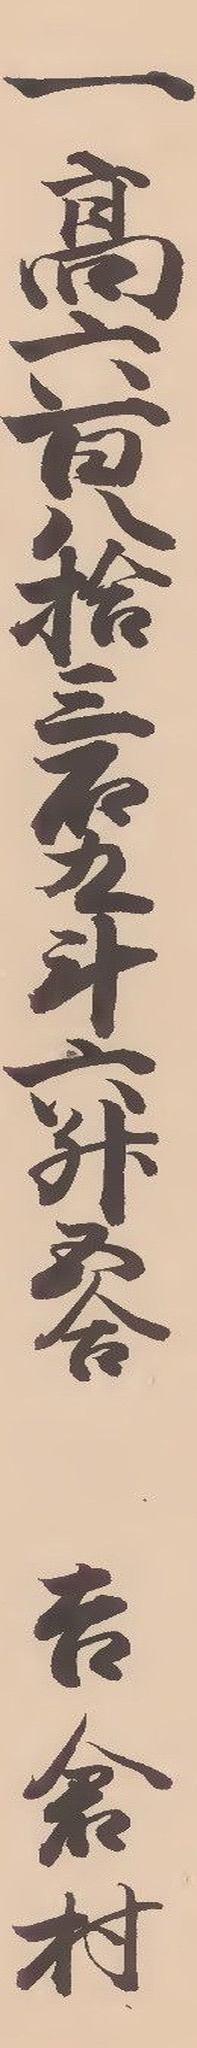一高六百八拾三石九斗六升五合吉倉村
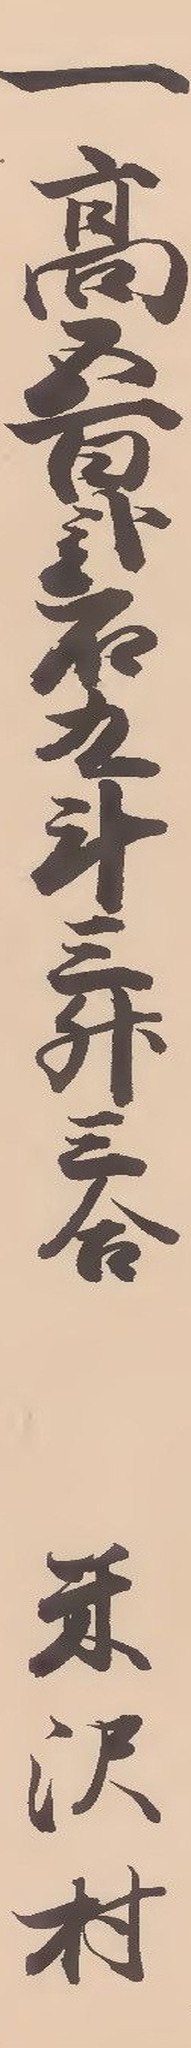一高五百弐石九斗三升三合米沢村
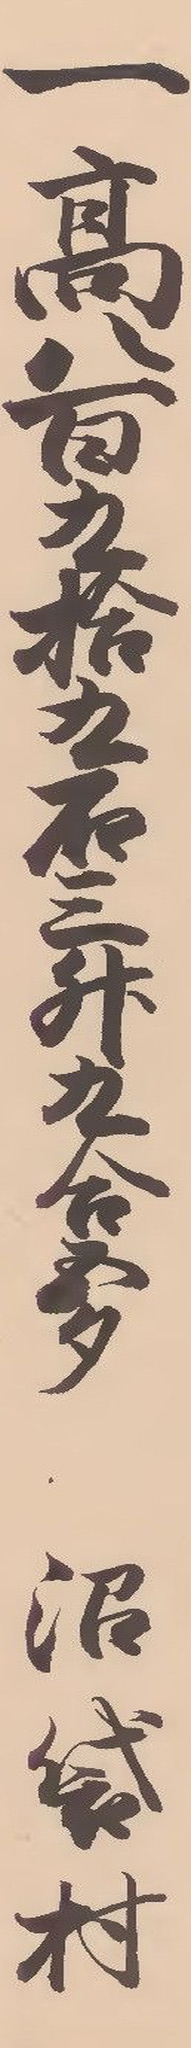一高八百九拾九石三升九合五勺沼袋村

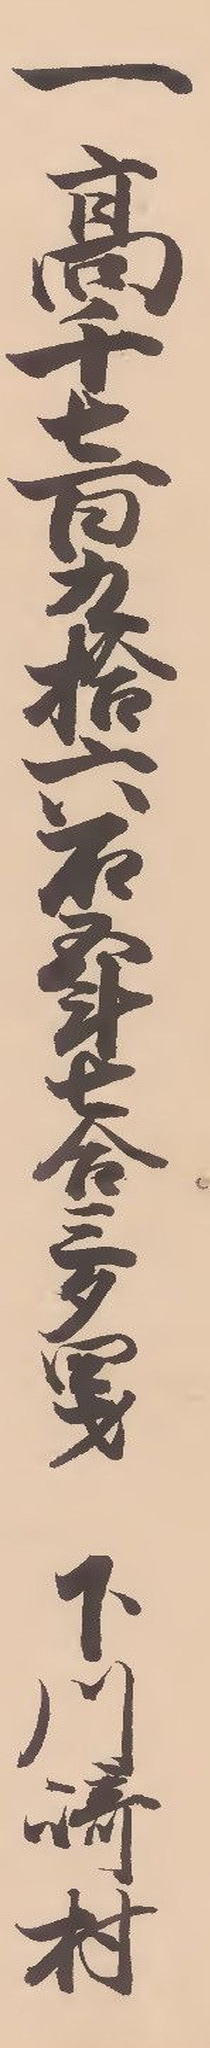一高千七百九拾六石五斗七合三勺四才下川崎村
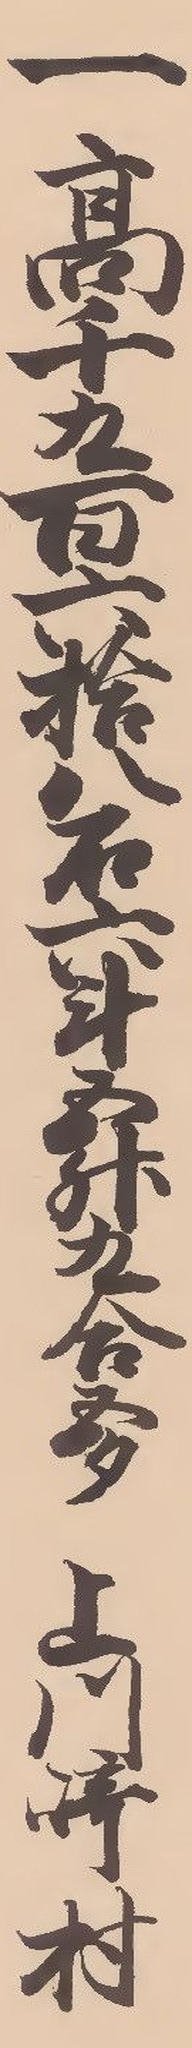一高千九百六拾八石六斗五升九合五勺上川崎村
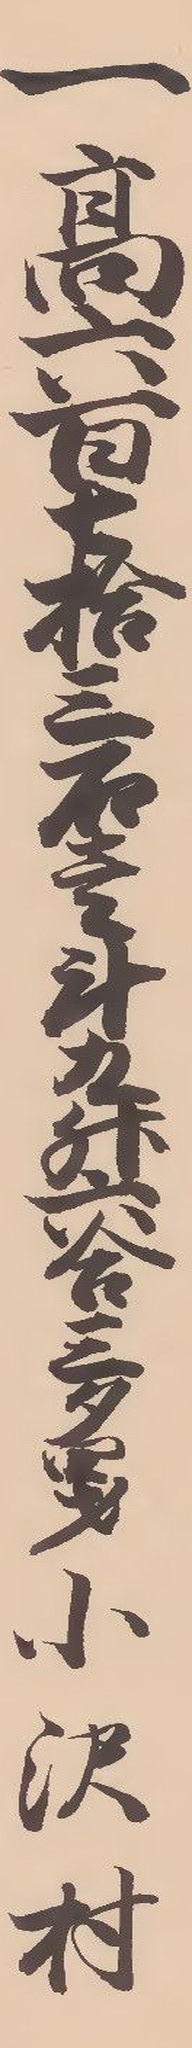一高六百七拾三石壱斗九升六合三勺四才小沢村
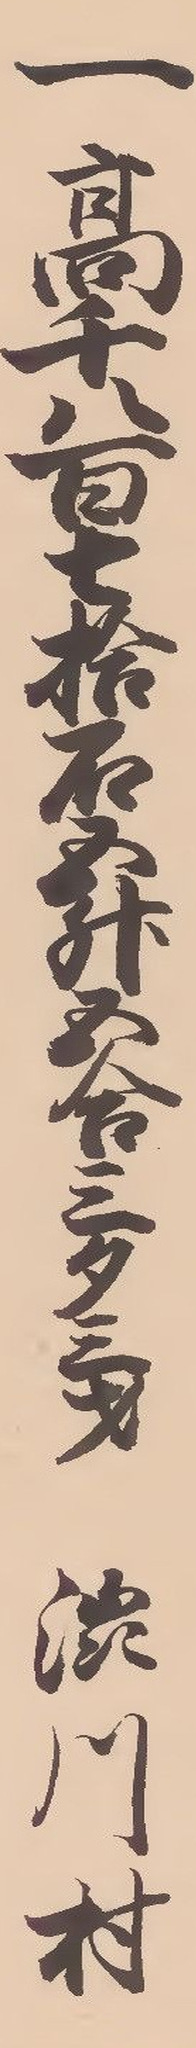一高千八百七拾石五升五合三勺三才渋川村
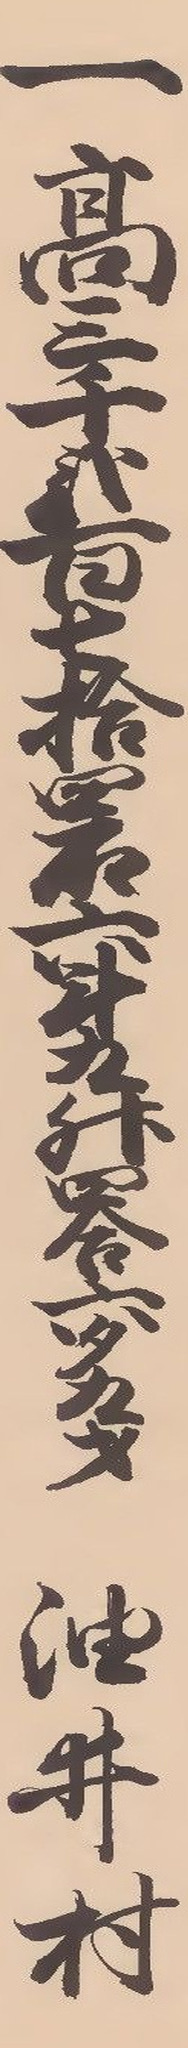一高三千弐百七拾四石六斗九升四合六勺九才油井村
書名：陸奥国郷帳　２
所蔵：国立公文書館 National Archives of Japan
